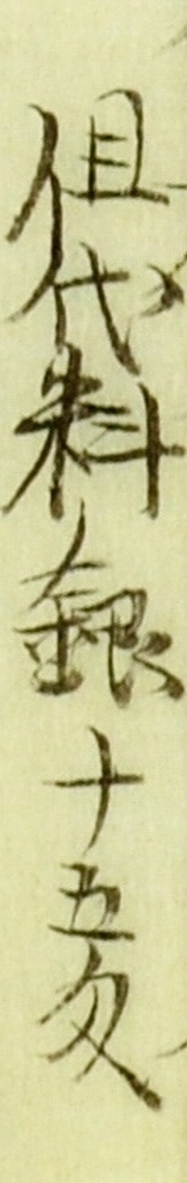但代料銀十五匁
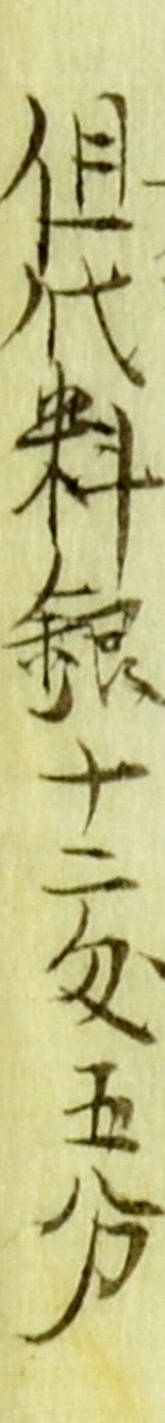但代料銀十二匁五分

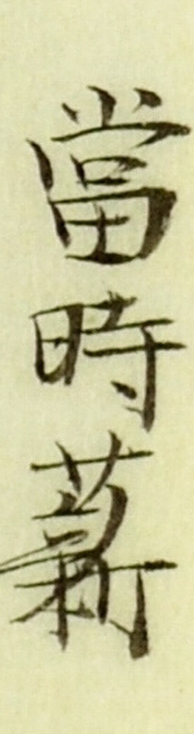当時薪
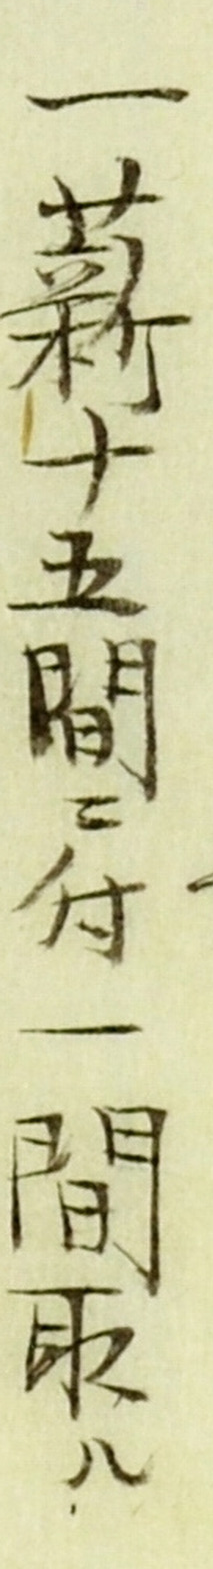一薪十五間ニ付一間取ル
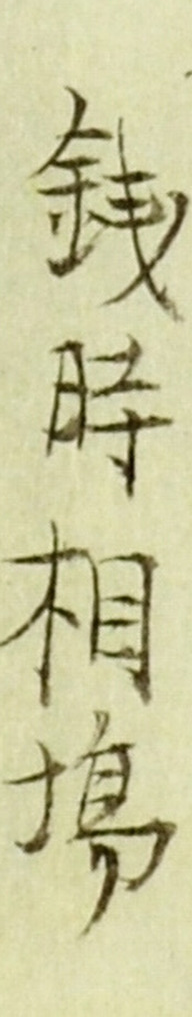銭時相場
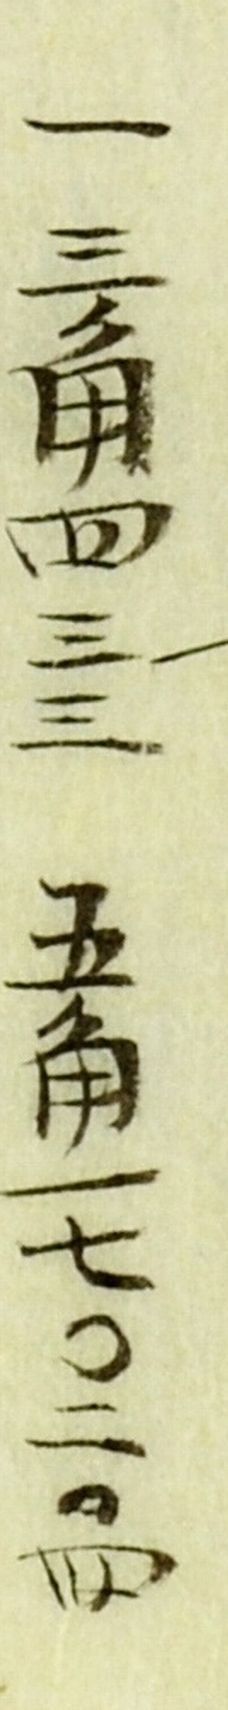一三角四三三五角一七〇二〇四
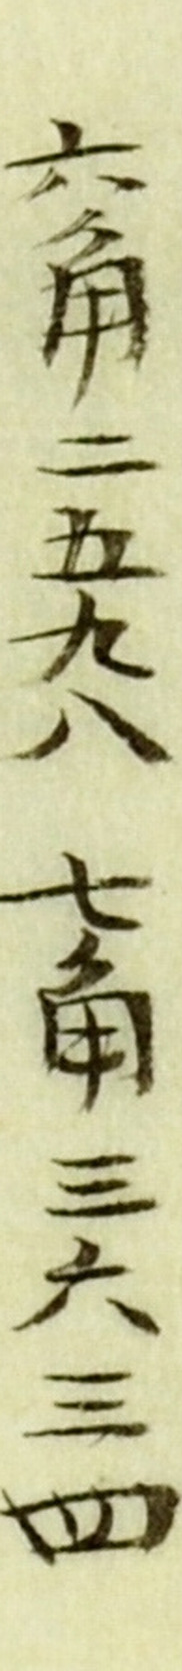六角二五九八七角三六三四
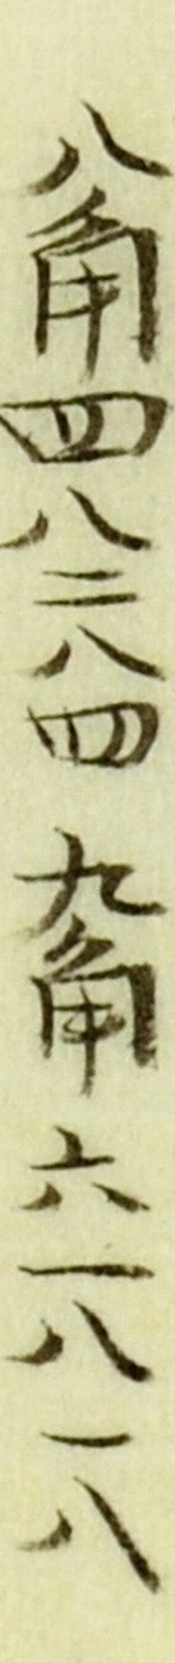八角四八二八四九角六一八一八
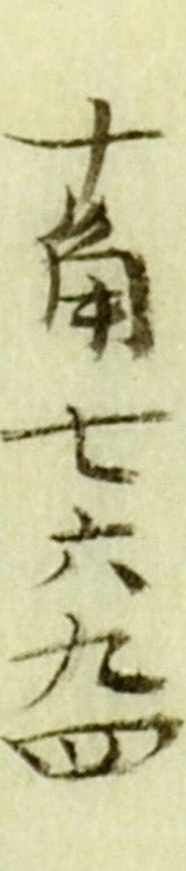十角七六九四
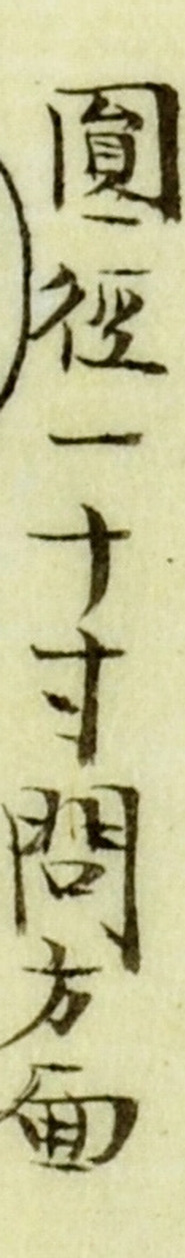円経一十寸問方面
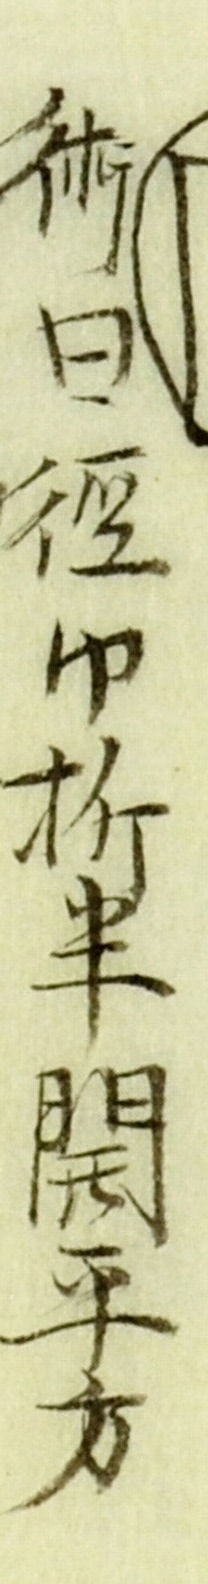術曰経巾折半開平方
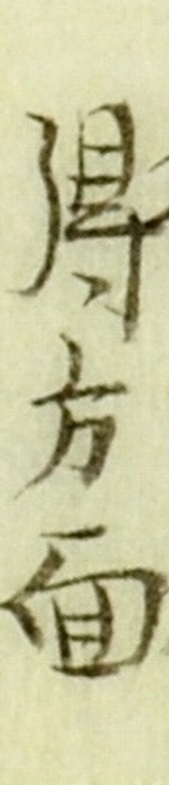得方面
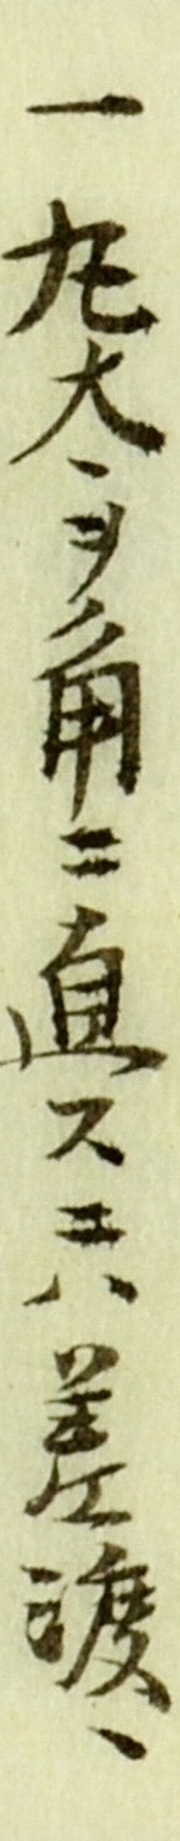一丸太ヲ角ニ直スニハ差渡、
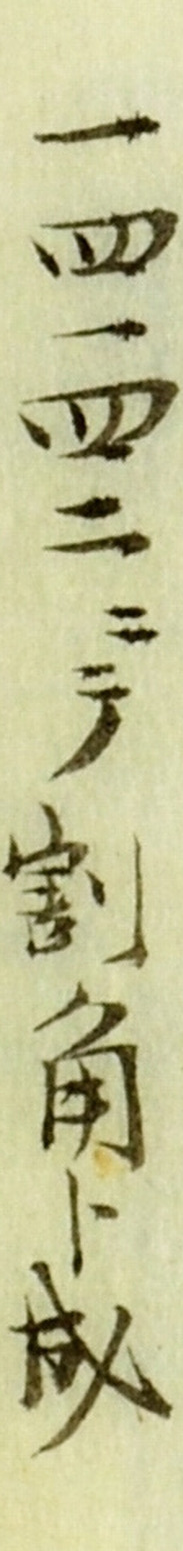一四一四二ニテ割角ト成
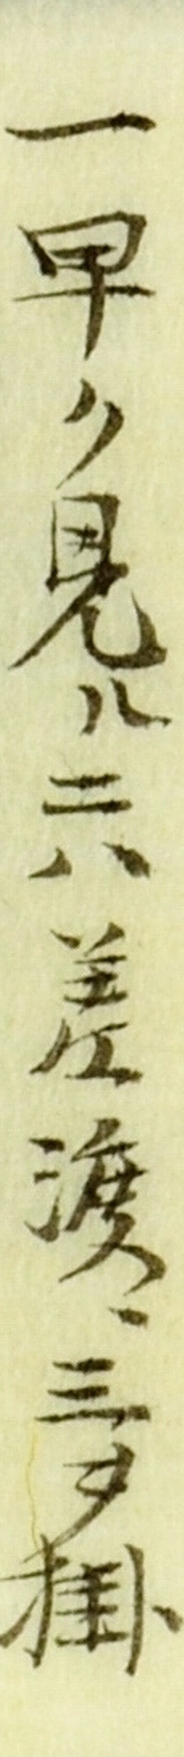一早ク見ルニハ差渡、三ヲ掛
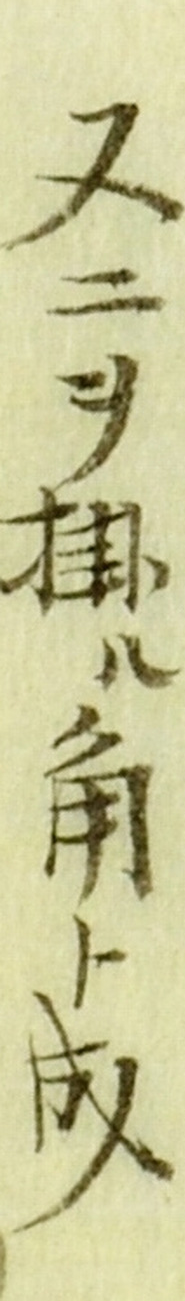又二ヲ掛ル角ト成
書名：分一御定法
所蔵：伊那市立高遠町図書館・合同会社AMANE
